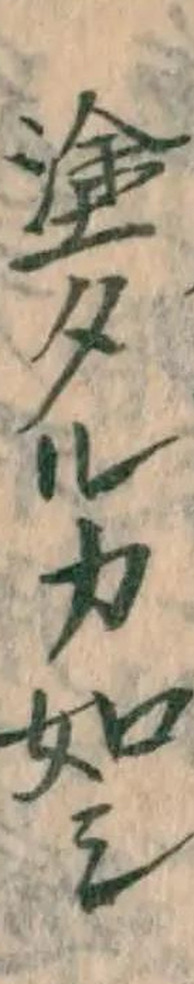塗タルカ如シ
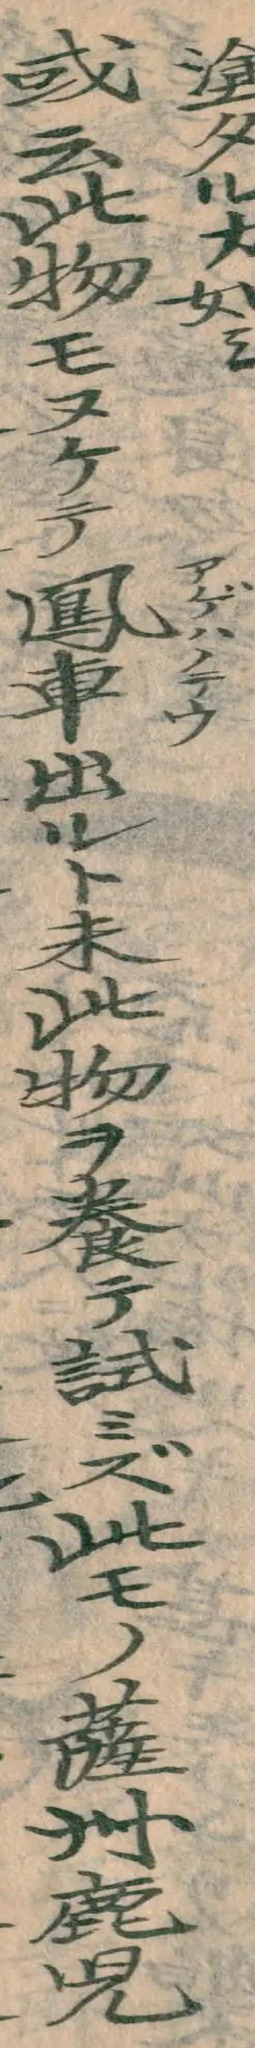或云此物モヌケテ鳳車出ルト未此物ヲ養テ試ミズ此モノ薩州鹿児
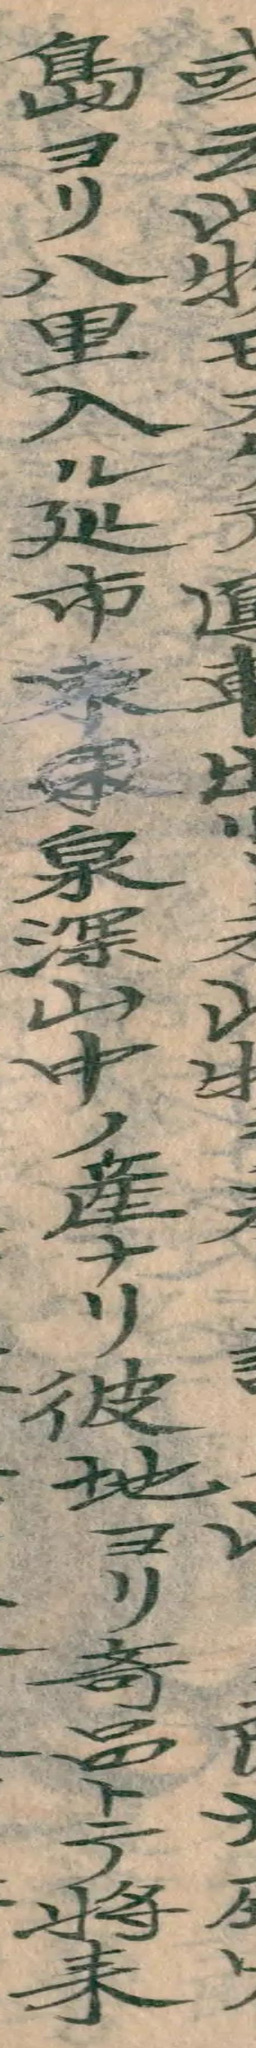島ヨリ八里入ル処市泉深山中ノ産ナリ彼地ヨリ奇品トテ将来
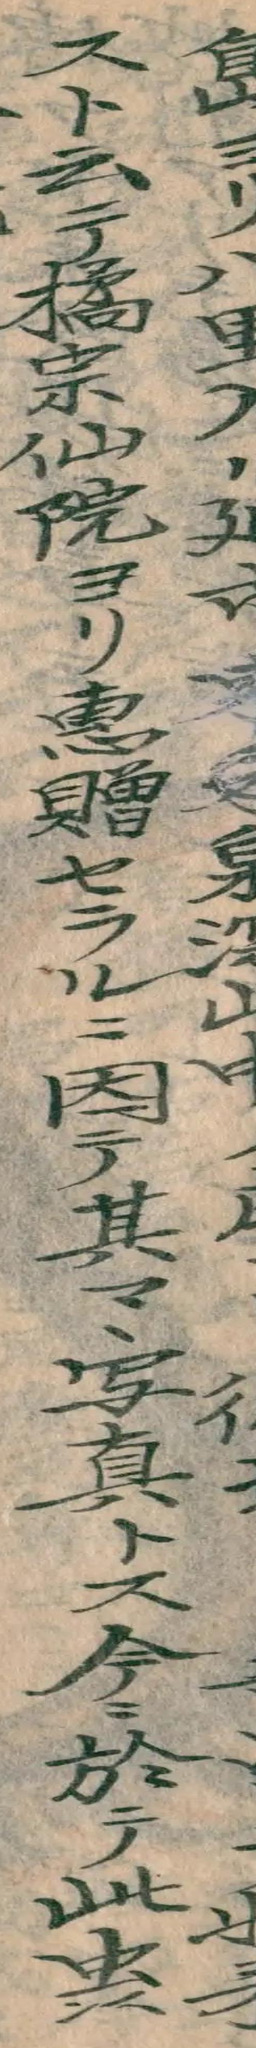スト云テ橘宗仙院ヨリ恵贈セラルニ因テ其マヽ写真トス今ニ於テ此蟲
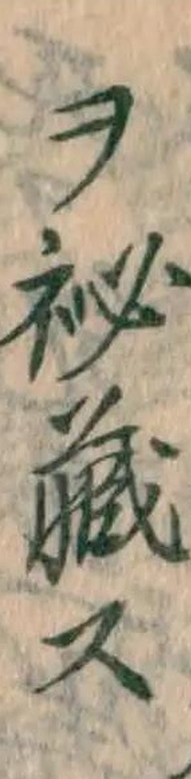ヲ秘蔵ス

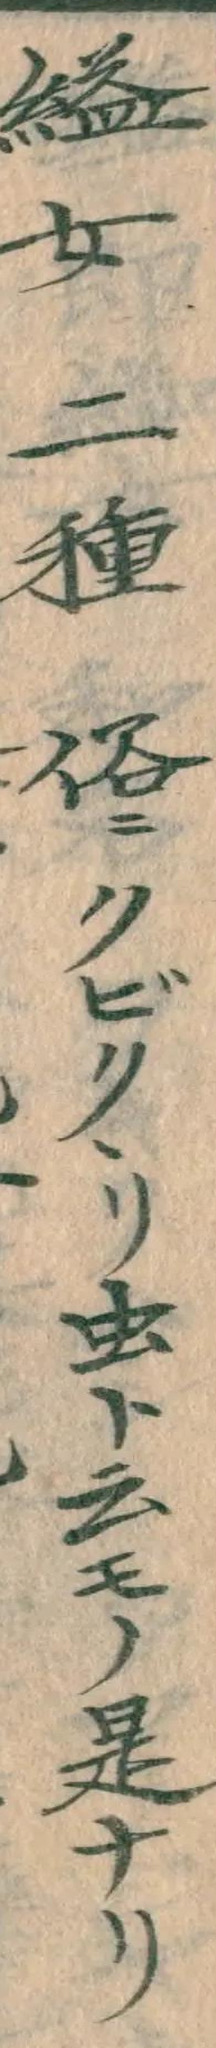縊女二種俗ニクビクヽリ虫ト云モノ是ナリ
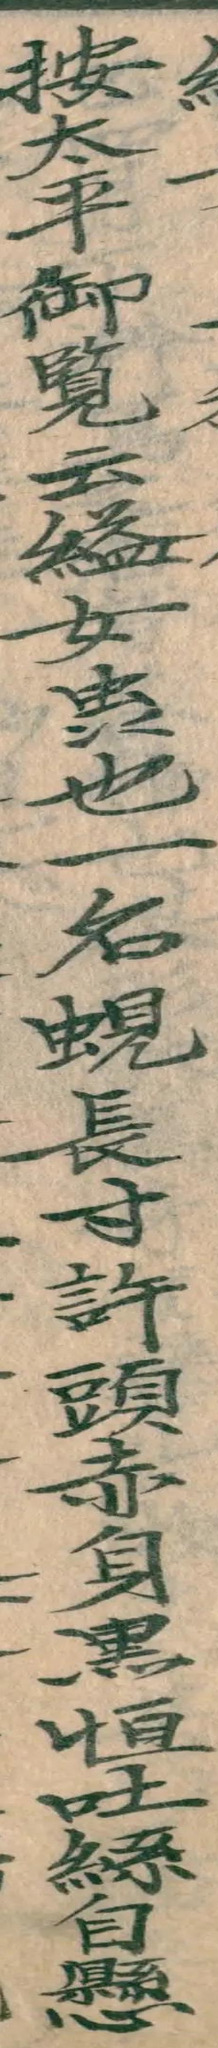按太平御覧云縊女蟲也一名蜆長寸許頭赤身黒恒吐糸自懸
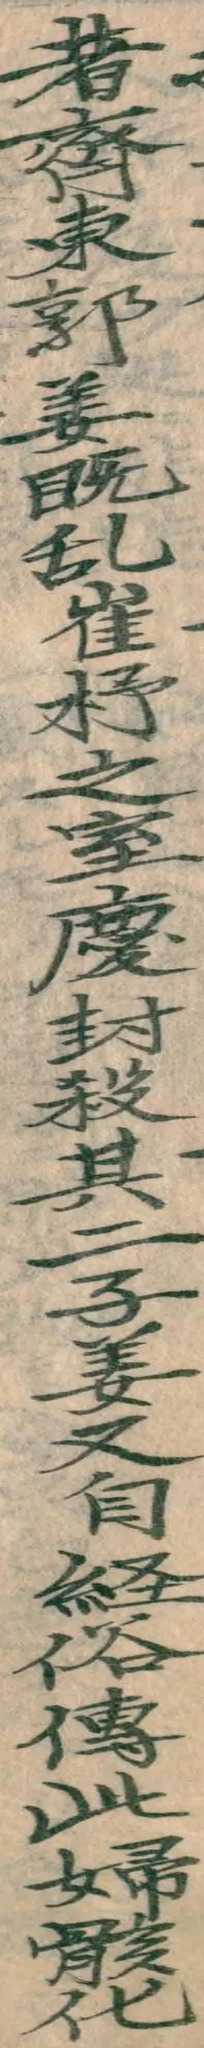昔斎東郭姜既乱崔杼之室慶封殺其二子姜又自経俗伝此婦骸化
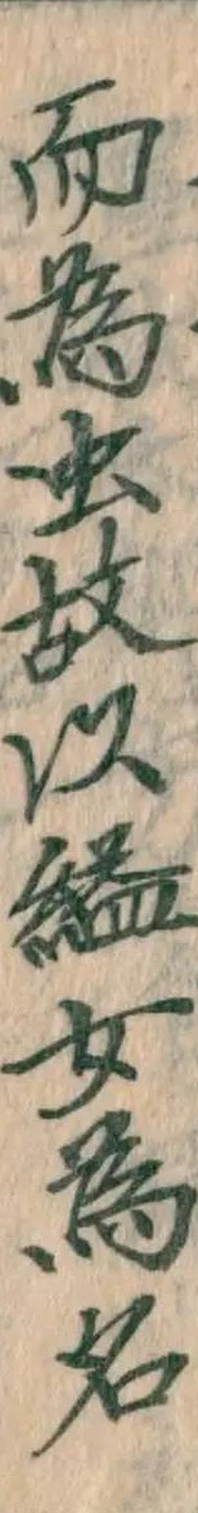而為虫故以縊女為名
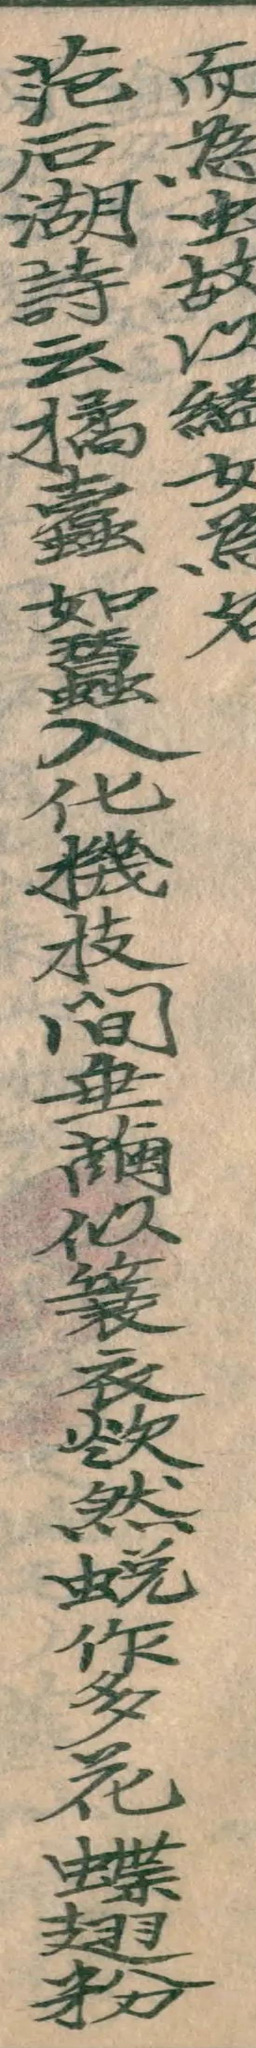范石湖詩云橘蠹如蚕入化機枝間垂繭似蓑衣欻然蛻作多花蝶翅粉
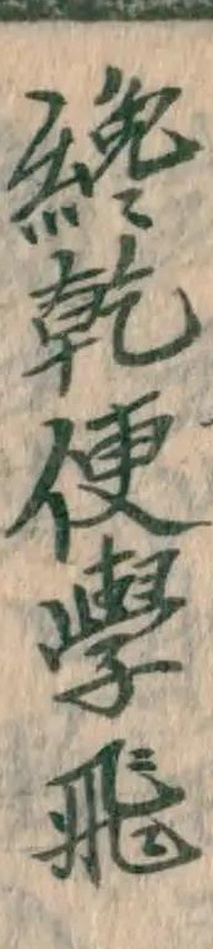纔乾便𫝯飛

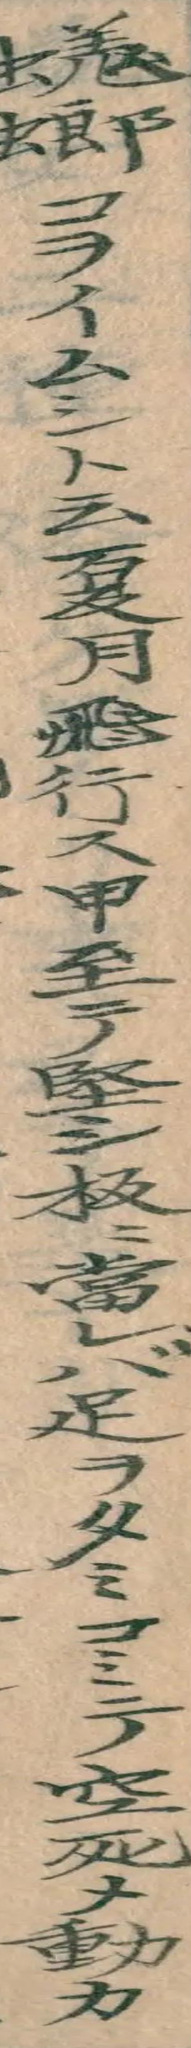蜣螂コヲイムシト云夏月飛行ス甲至テ堅シ板ニ当レバ足ヲタミコミテ空死シテ動カ
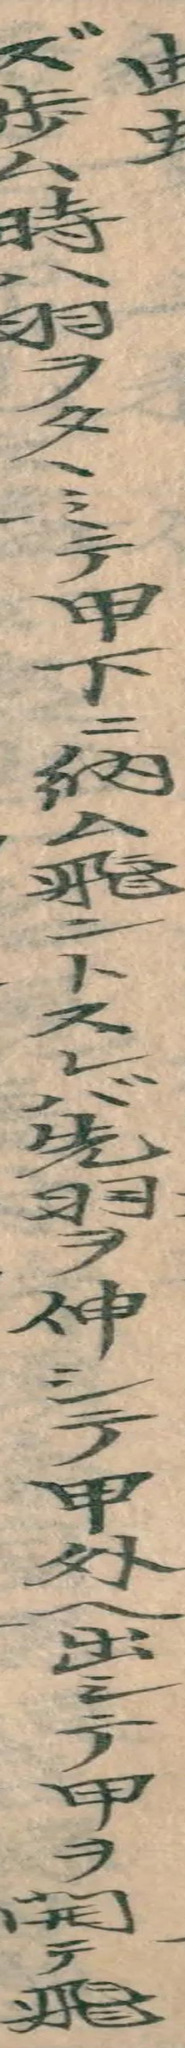ズ歩ム時ハ羽ヲタヽミテ甲下ニ納ム飛ントスレバ先羽ヲ伸シテ甲外ヘ出シテ甲ヲ開テ飛
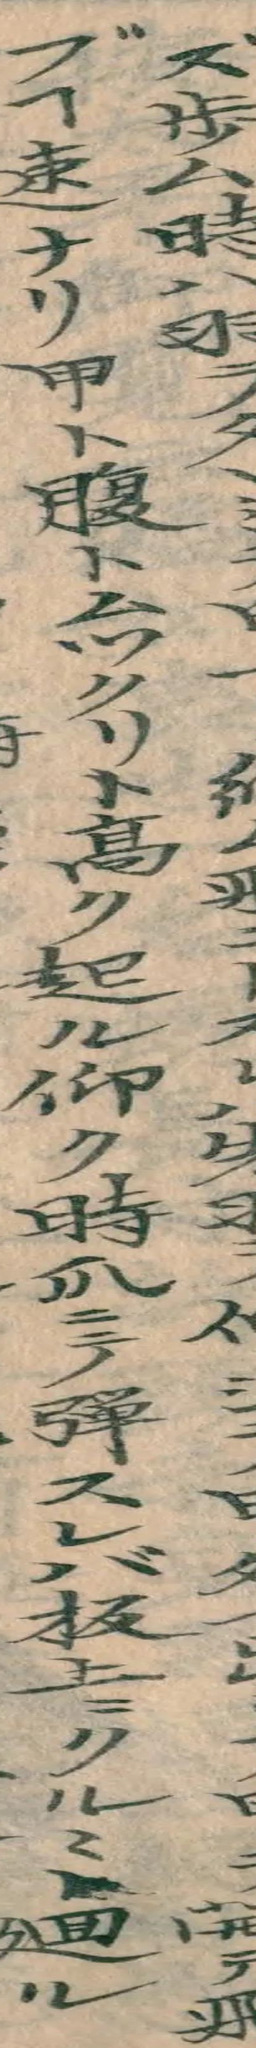ブコト速ナリ甲ト腹トムツクリト高ク起ル仰ク時爪ニテ弾スレバ板上ニクル々廻ル
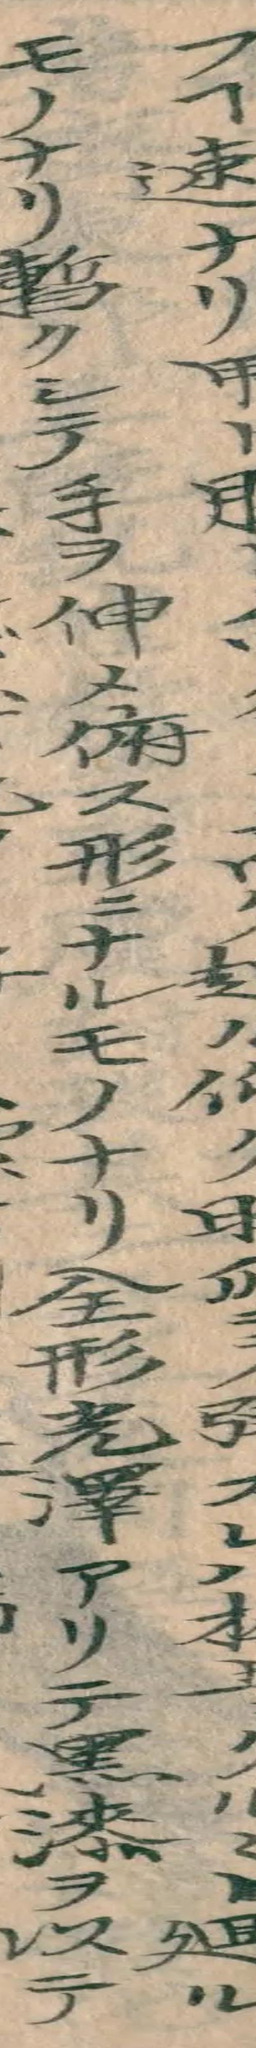モノナリ暫クシテ手ヲ伸シテ俯ス形ニナルモノナリ全形光澤アリテ黒漆ヲ以テ
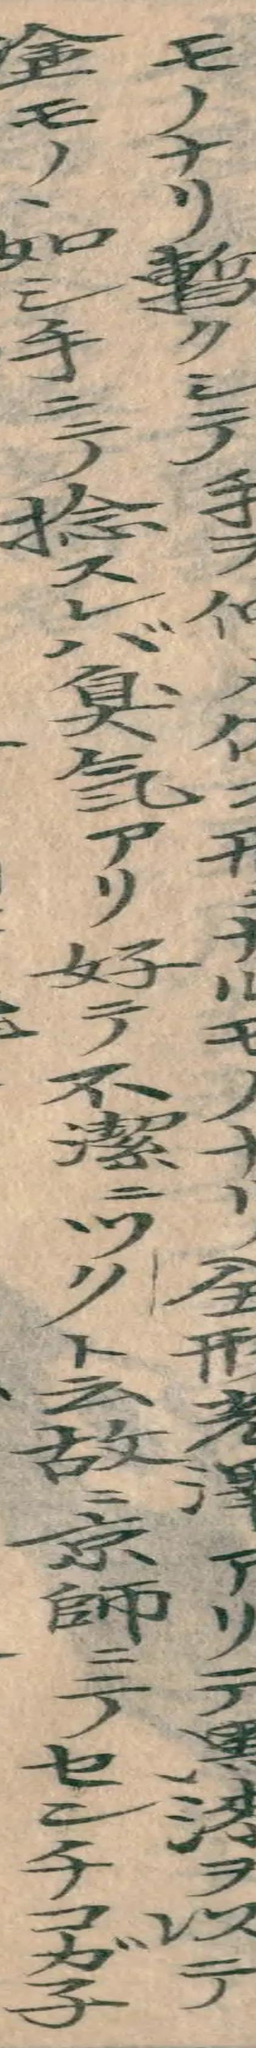塗モノヽ如シ手ニテ捻スレバ臭気アリ好テ不潔ニツクト云故ニ京師ニテセンチコガネ
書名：千蟲譜 3巻. [3]
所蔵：国立国会図書館 National Diet Library, JAPAN
